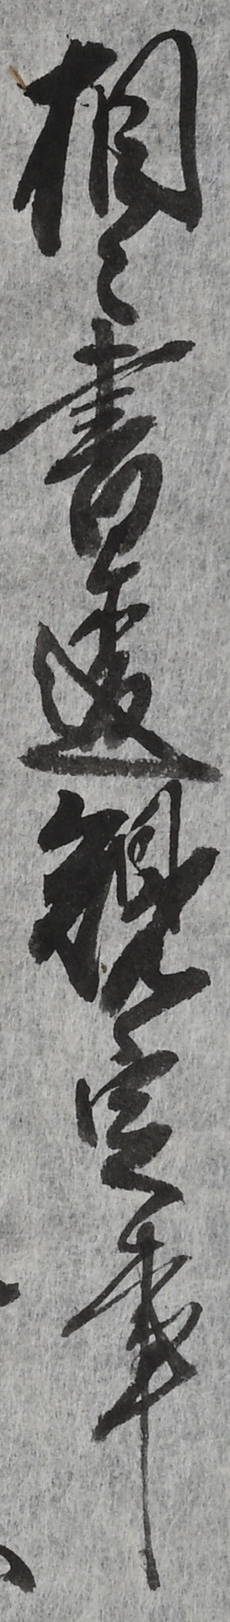相々書違規定事
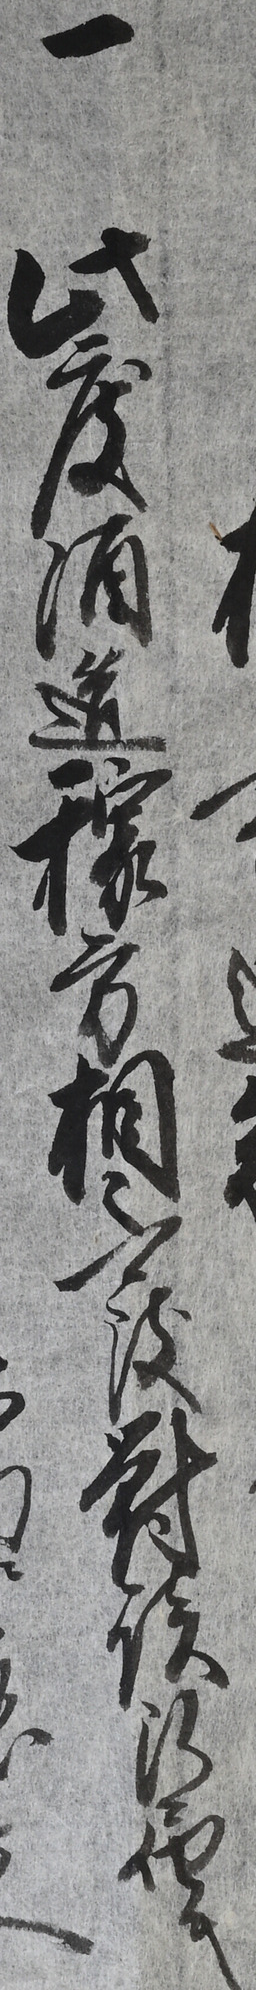一此度酒造稼方相々可致対談行届キ
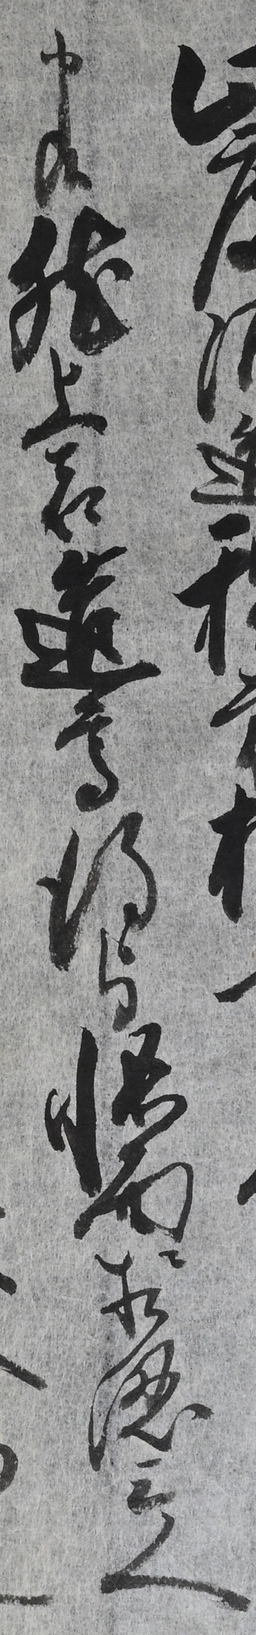申候然上は造得と帳面ニ相認三人
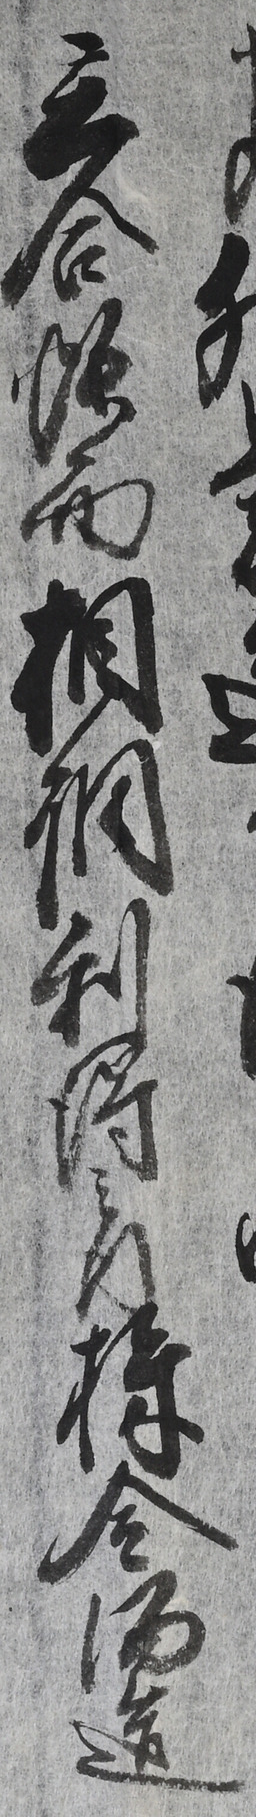立合帳面相調利得之内株金酒造
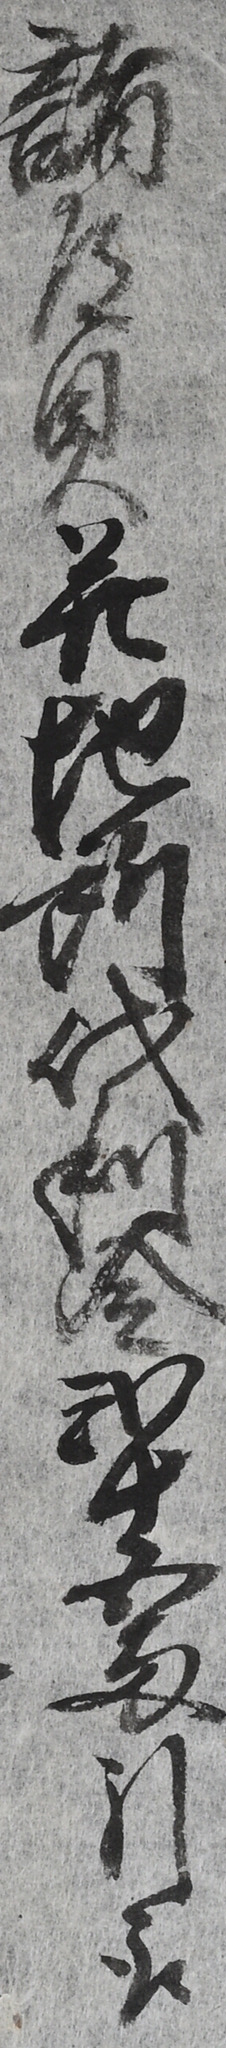諸道具并地所代利金弐十五両引取
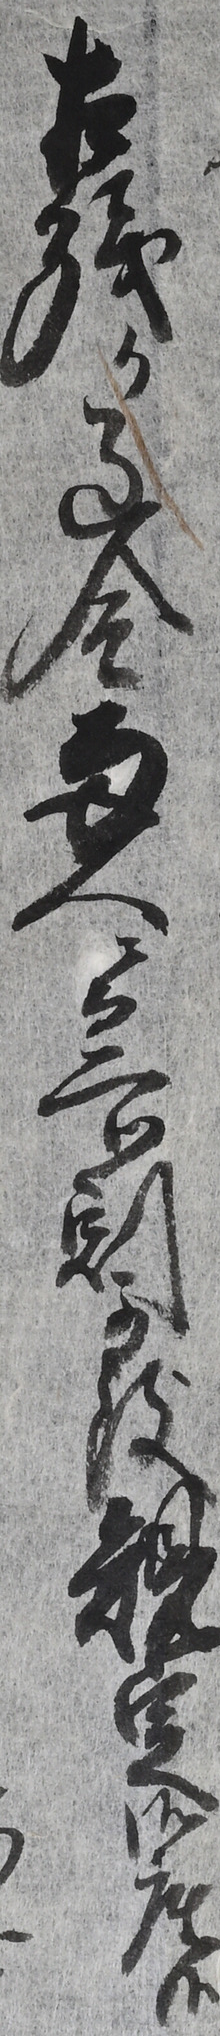相残り過金両人ニ而二日割可致規定御座候
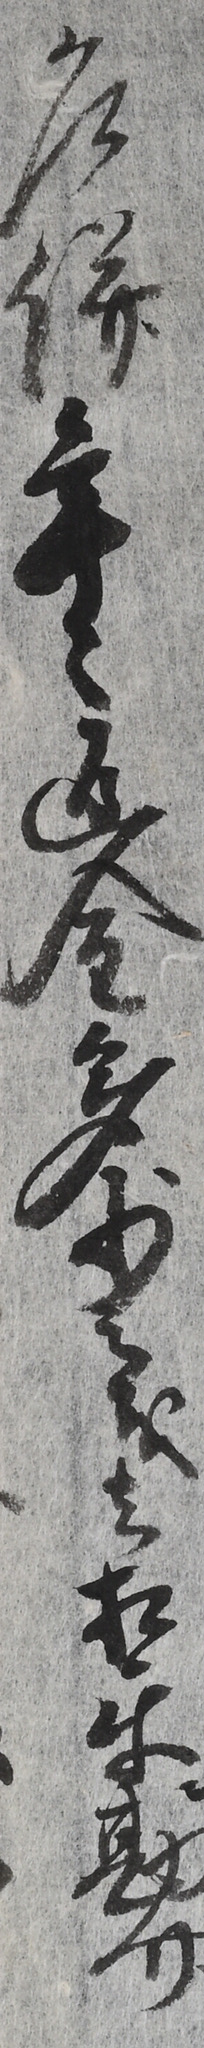乍併年々返金多少之義は相互ニ勘介
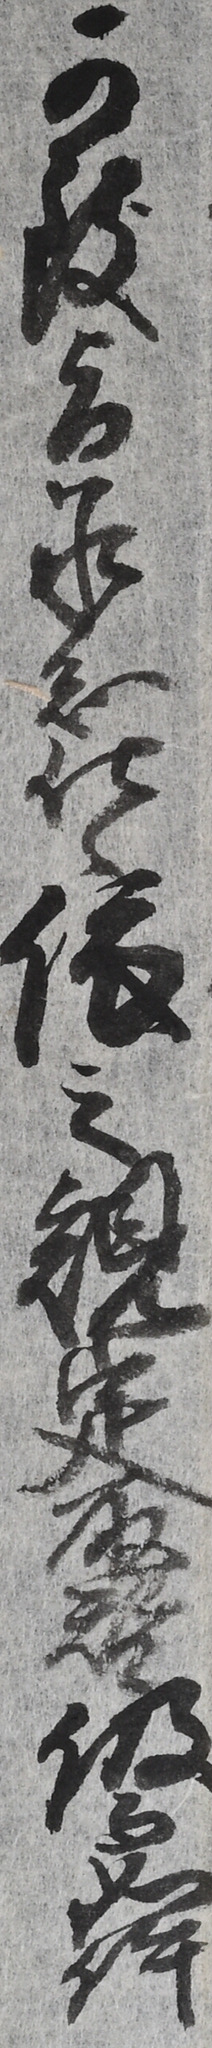可致旨承知仕候依之規定取替仍而如件
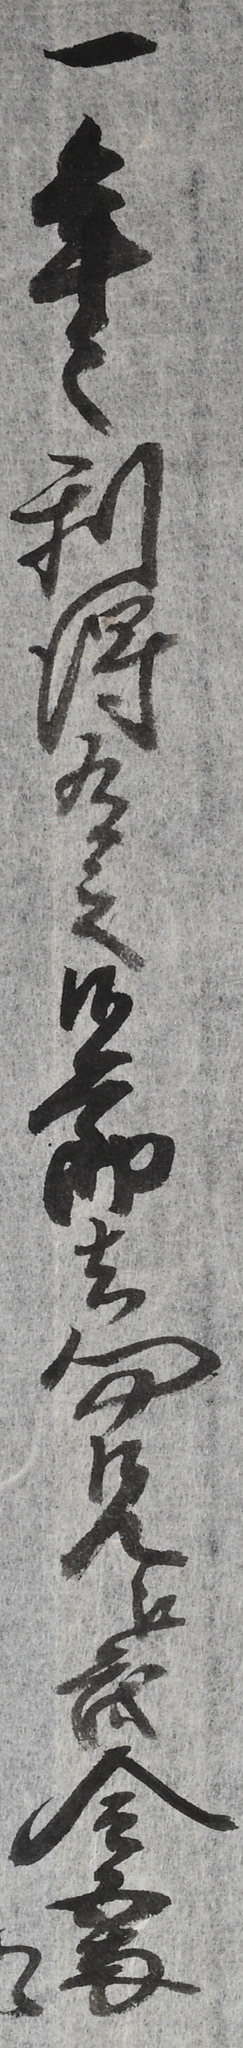一年々利得有之候節は兄江も金五両ツヽ
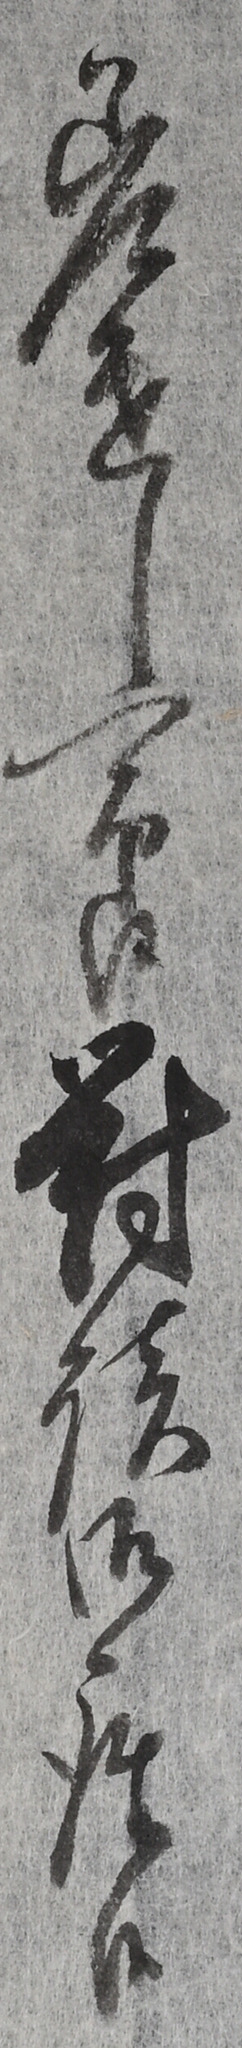差遣し可申候対談御座候
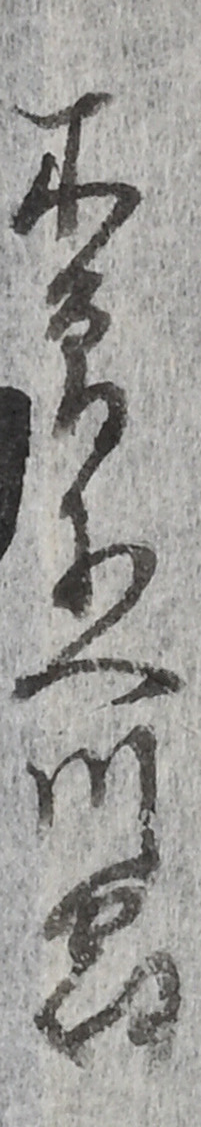木曽にへ川宿
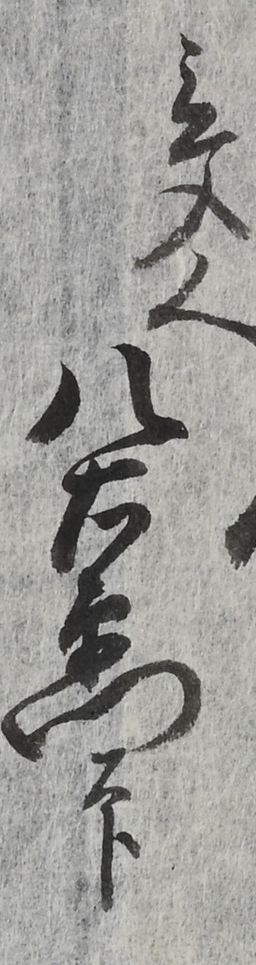八右衛門印
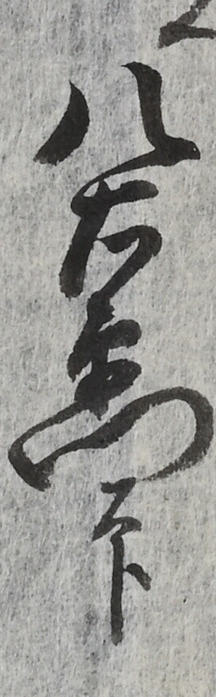八右衛門印
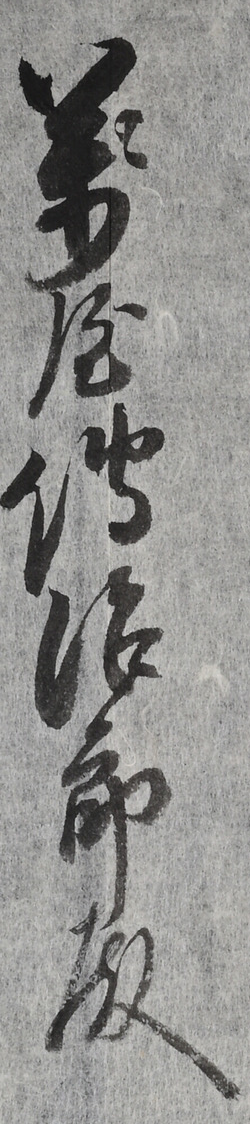万屋伝治郎殿
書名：相々書違規定事
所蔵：伊那市立高遠町図書館・合同会社AMANE
